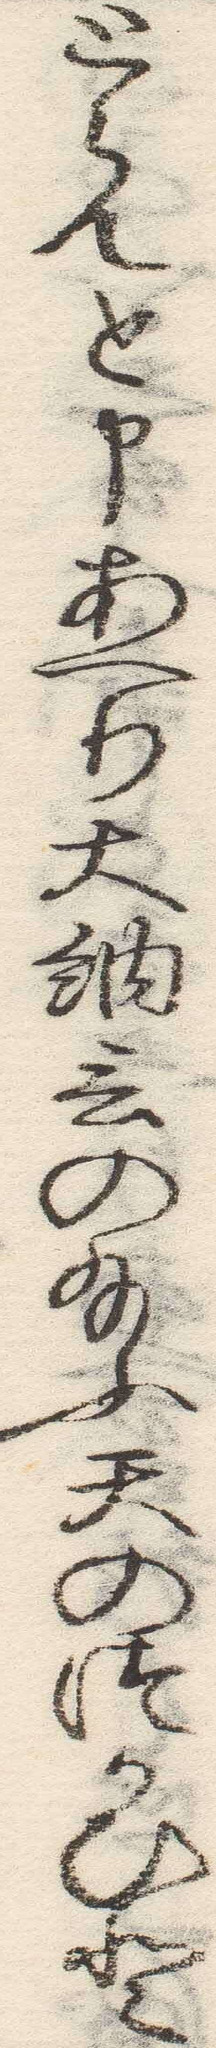ととらんと申あへり大納言の給ふ天のつかひと
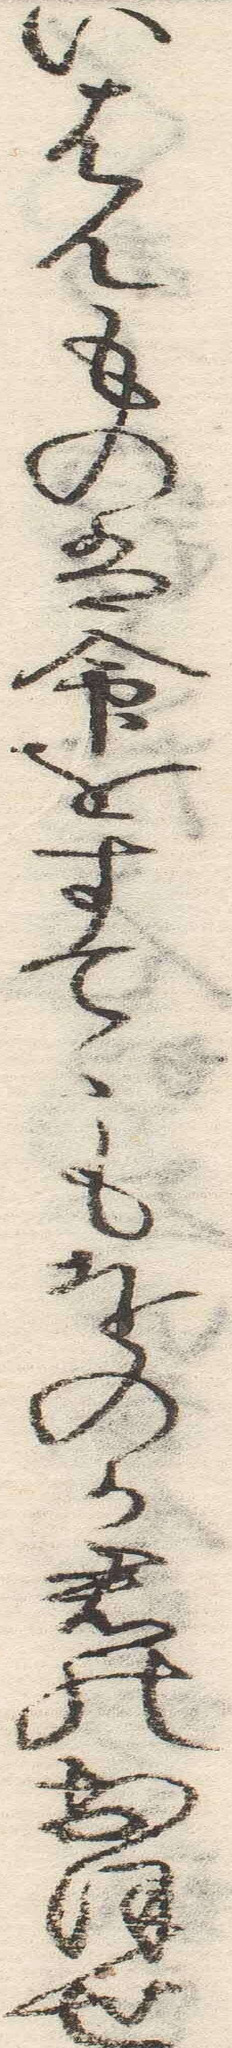いはんものは命をすてゝもをのか君のおほせ
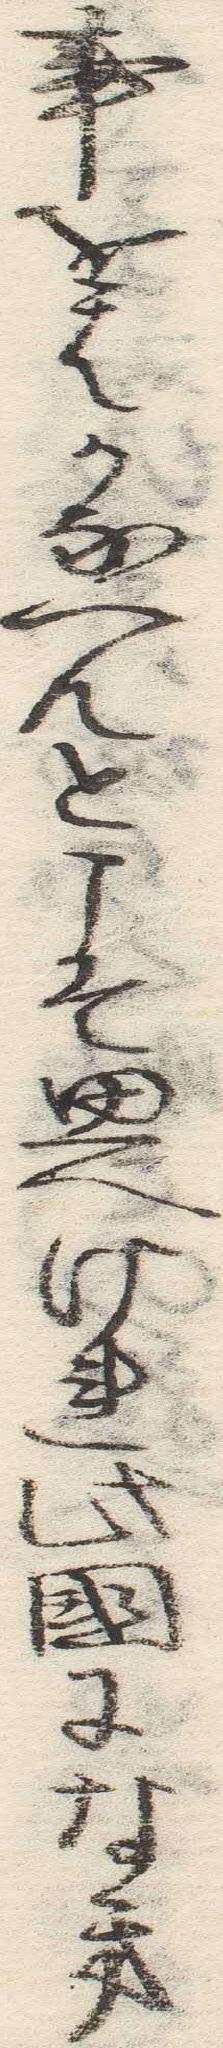事をはかなへんとこそ思へけれ此国なき
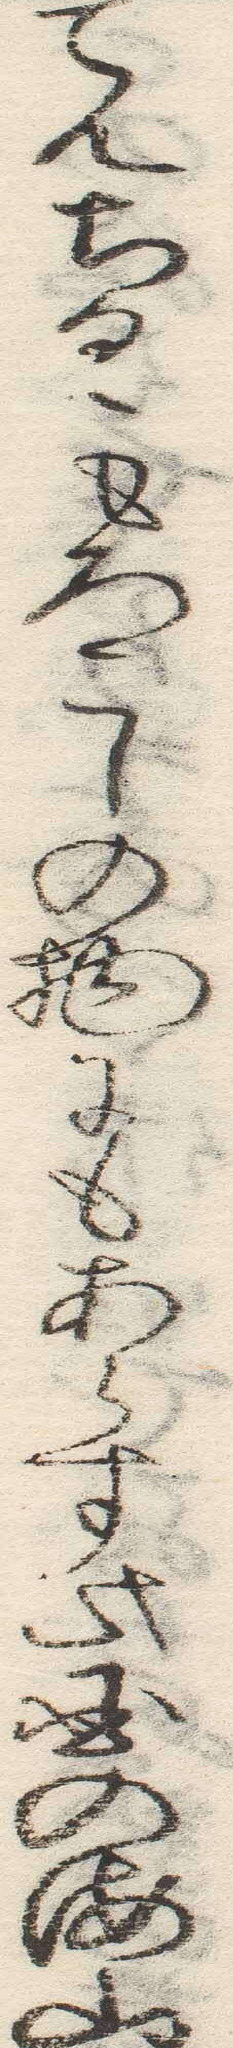てんちくもろこしの物にもあらす此国の海山
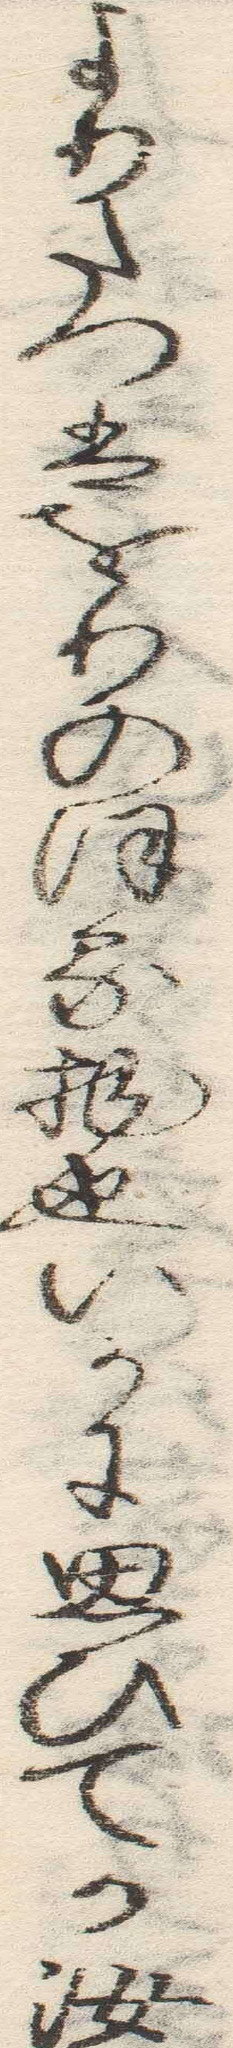よりたつはをりのほる物也いかに思ひてか汝
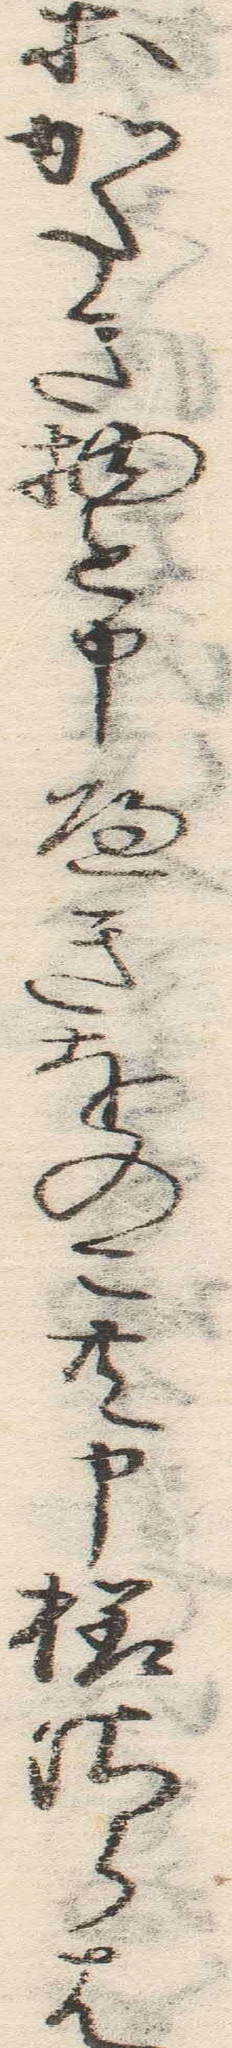等かたき物と申へきをのこ共申様さらは
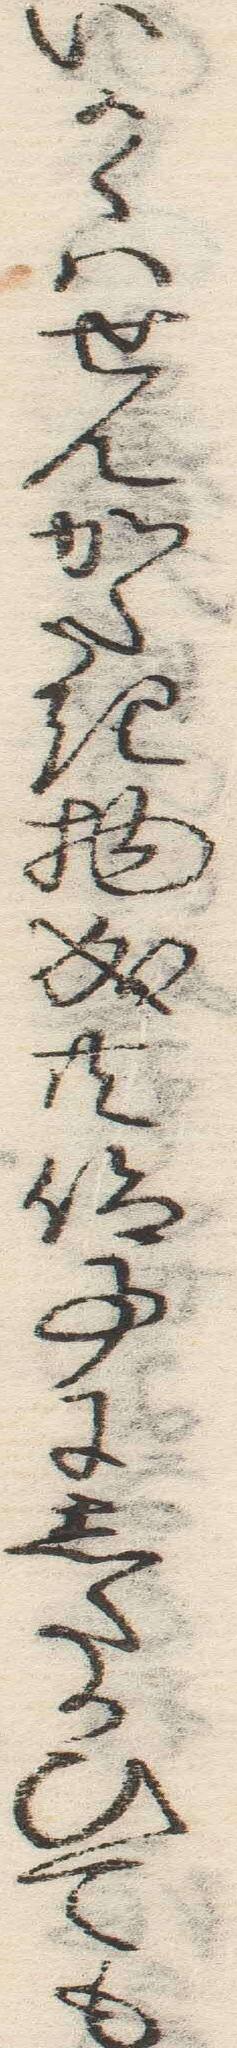いかゝはせんかたき物成共仰事にしたかひても
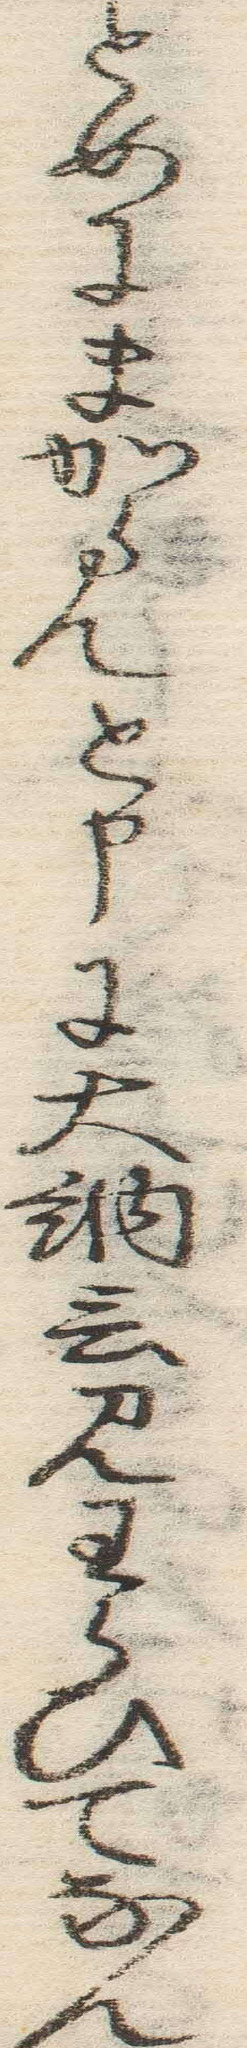とめにまからんと申に大納言見わらひてなん
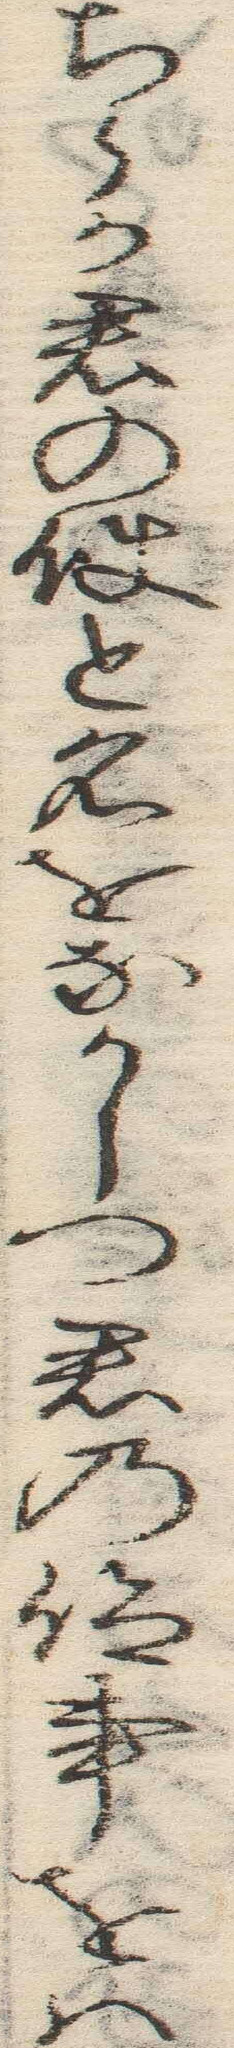ちらか君の使と名をなかしつ君の仰事をは

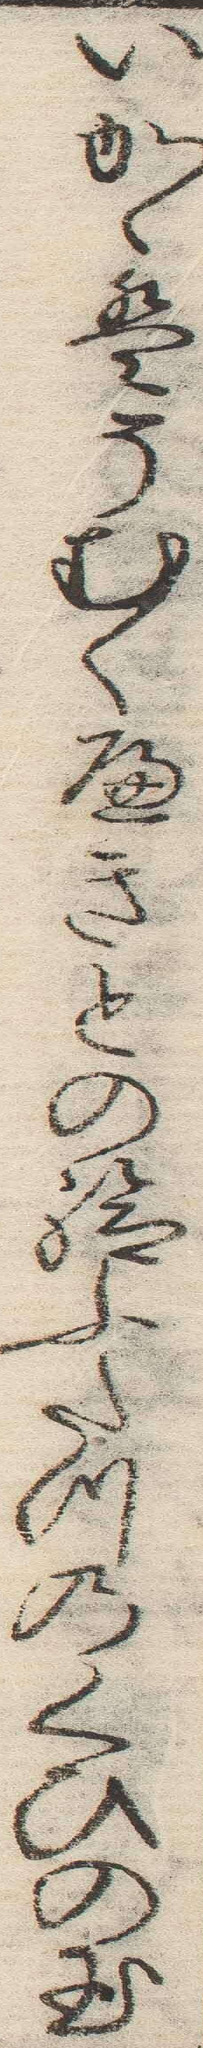いかゝはそむくへきとの給ふたつのくひの玉
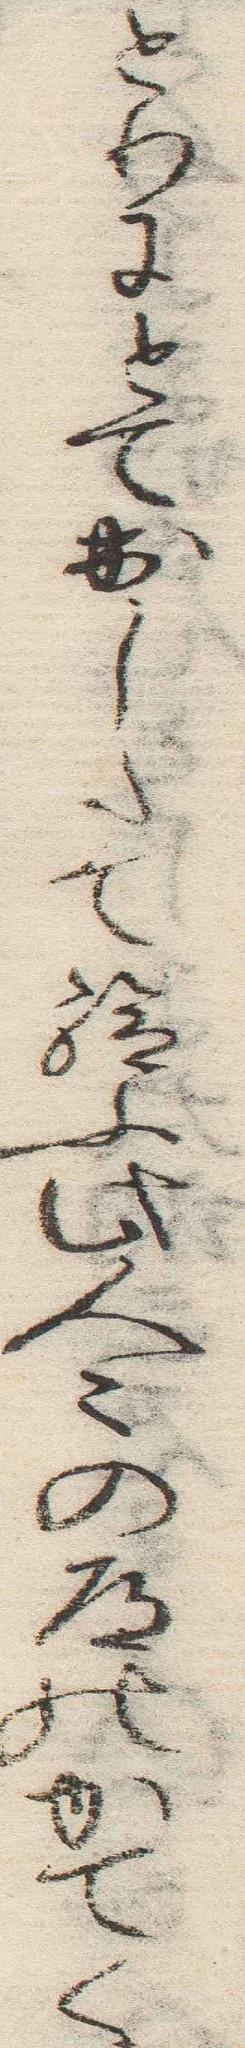とりにとて出したて給ふ此人々の道のかてく
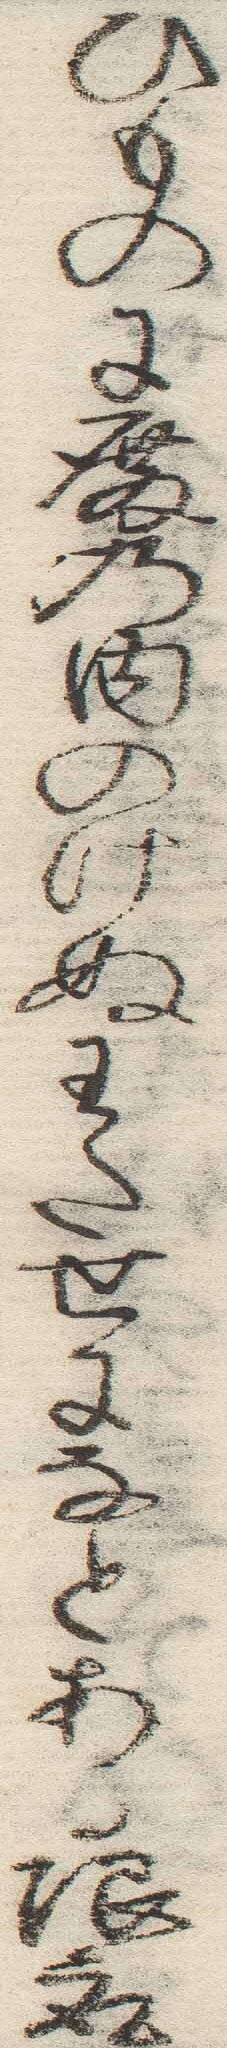ひものに殿の内のけぬわたせになとある限取
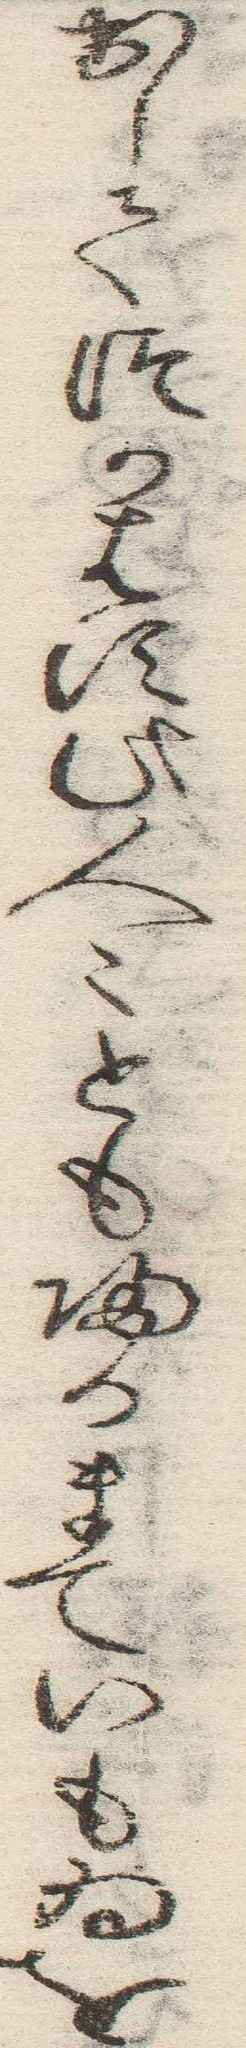出してつかはす此人々とも帰るまていもゐを
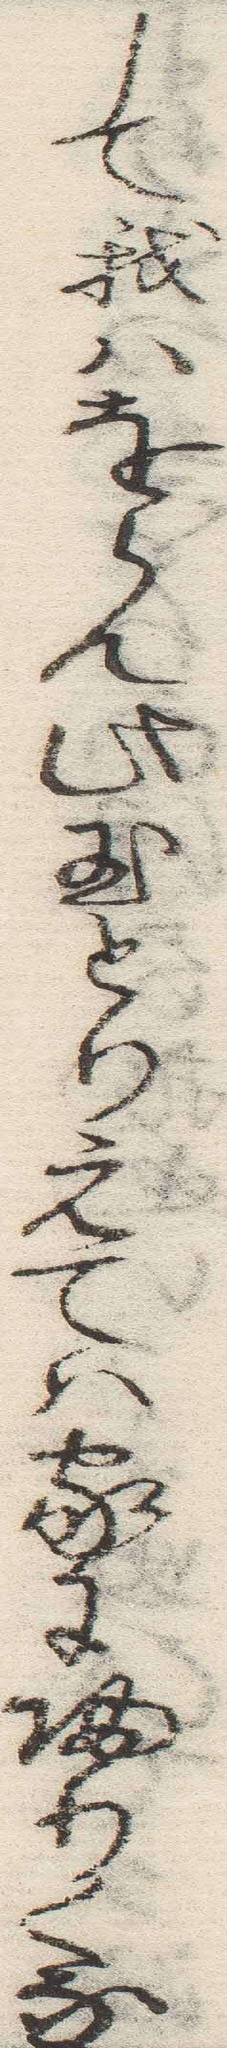して我はをらん此玉とりえては家に帰りくな
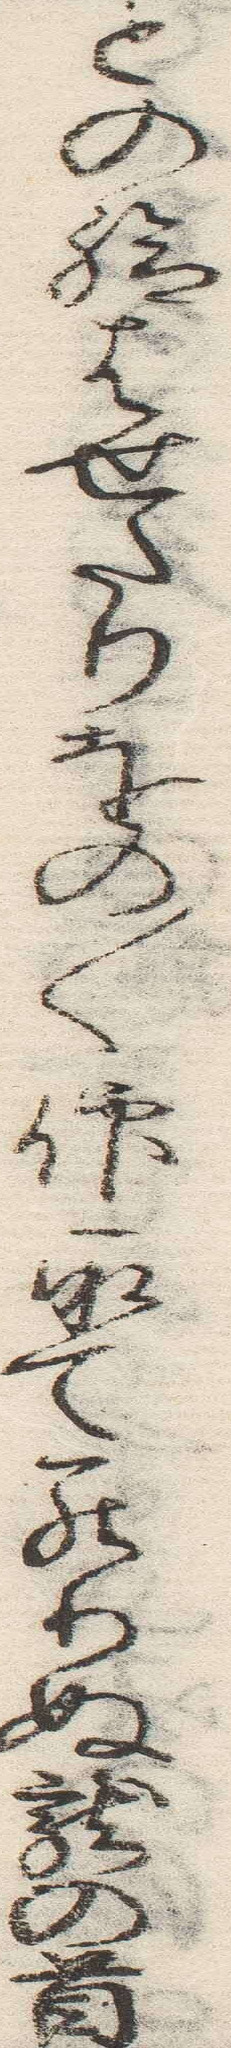との給はせたりをの〳〵仰承て罷りぬ龍の首
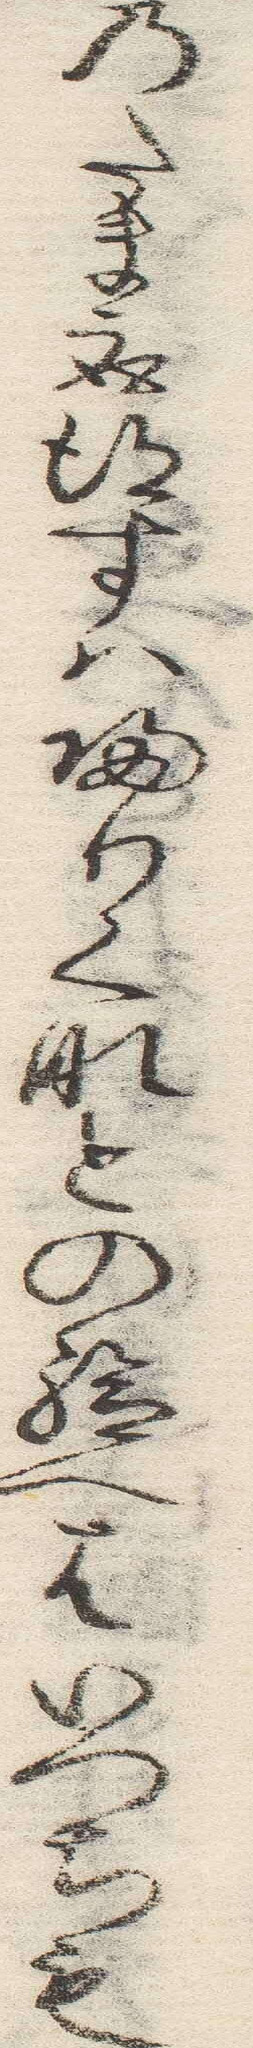のたま取得すは帰りくなとの給へはいつちも
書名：竹取物語
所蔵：東京学芸大学附属図書館 国文学研究資料館
